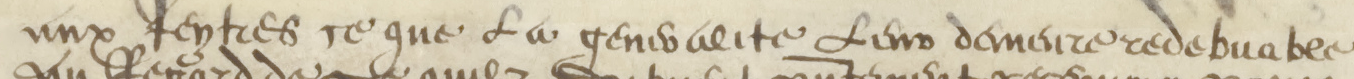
aux Reytres ce que la generalite leur demeure redevuable
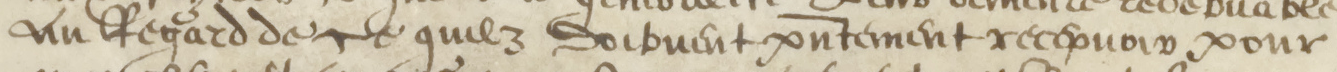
au Regard de ce quilz doivuent pntement recepuoir pour
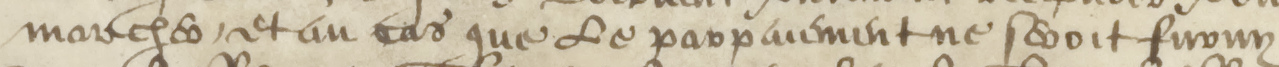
marcher, et au cas que le par paiement ne seroit furny
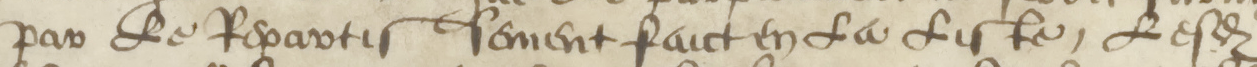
par le Repartissement faict en la liste, lesd
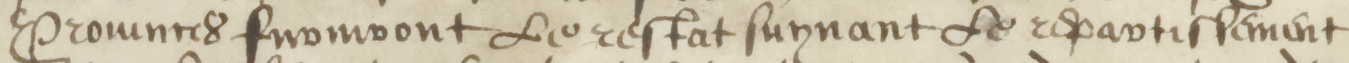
Provinces furniront le restat suyuant le repartissement
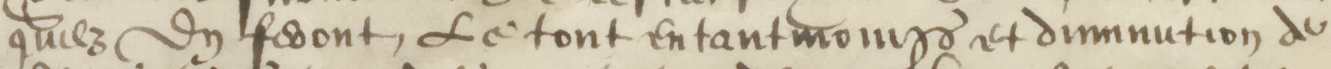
quilz en feront, le tout entant moings et diminution de
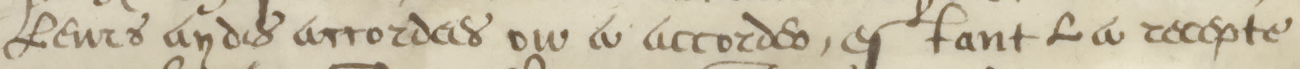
leurs aydes accordees ou a accorder, estant la recepte
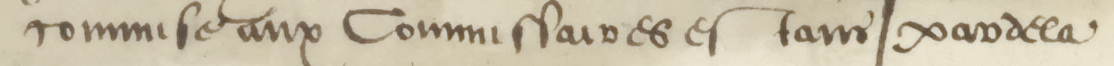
commise aux Commissaires estans par dela
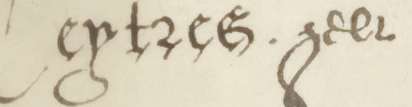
Reytres. gelt
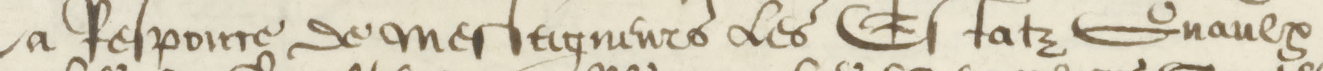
La Responce de messeigneurs les Estatz Gnaulx
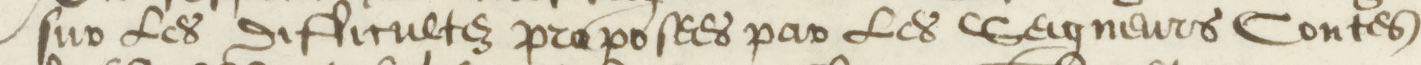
sur les difficultez proposees par les Seigneurs Contes
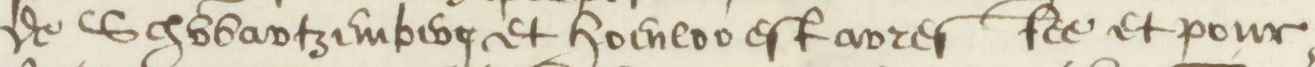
de Schwartzemberg et Hoenloo est arrestee et pour
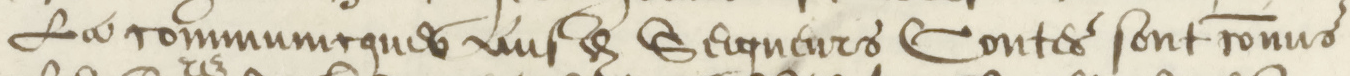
la communicques ausd Seigneurs Contes sont conus
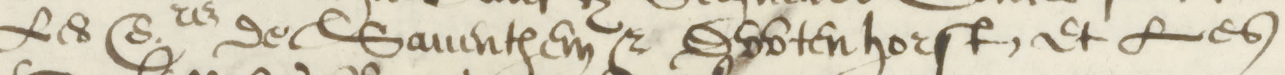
les Srs. de Sauenthem & Obbtenhorst, et les
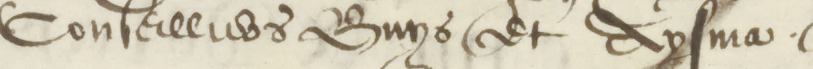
Conseilliers Buys et Aysma.
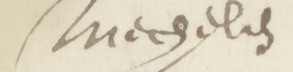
Mechelen
